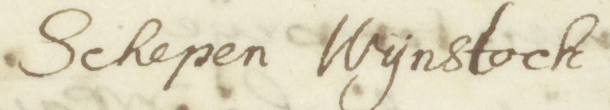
Schepen Wijnstock
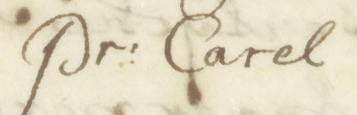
Pr: Carel
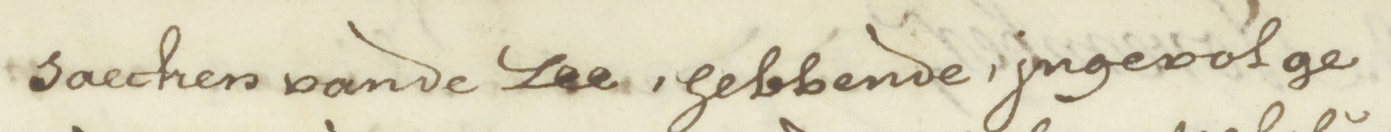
saecken vande Zee, hebbende ingevolge
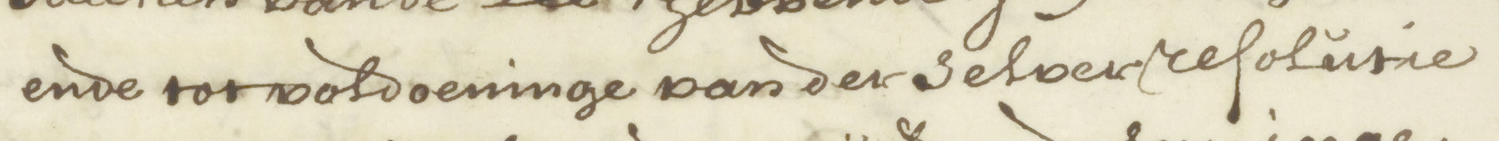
ende tot voldoeninge van der selver resolutie
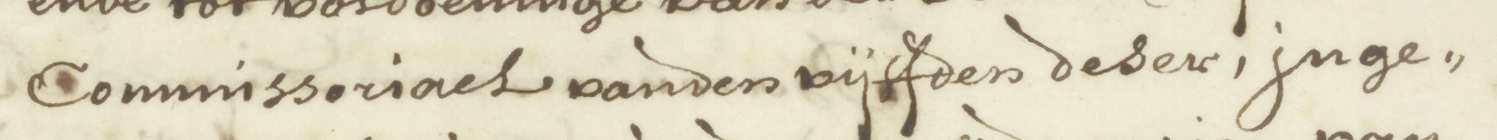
Commissoriael vanden vijffden deser, inge„
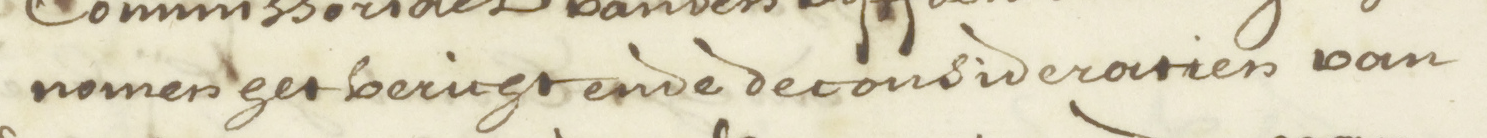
nomen het bericht ende de consideratien van
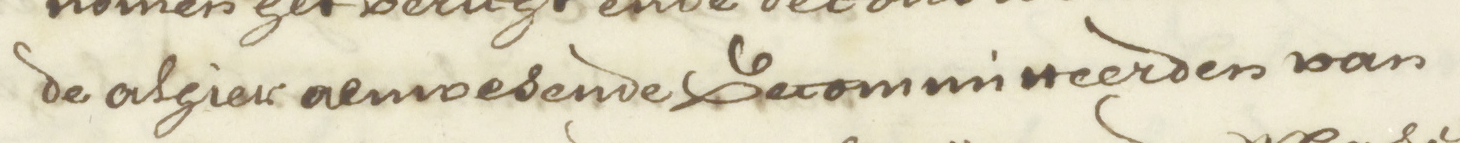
de alhier aenwesende Gecommitteerden van
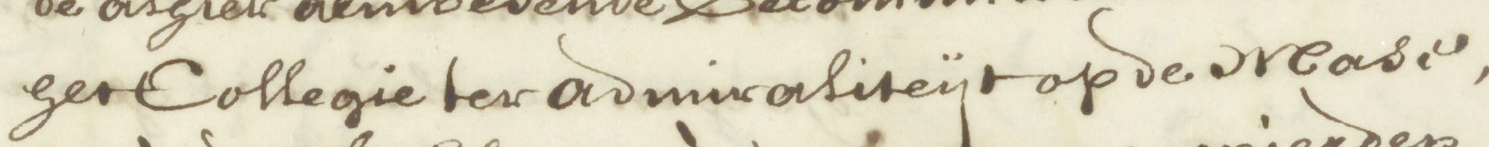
het Collegie ter admiraliteijt op de Mase
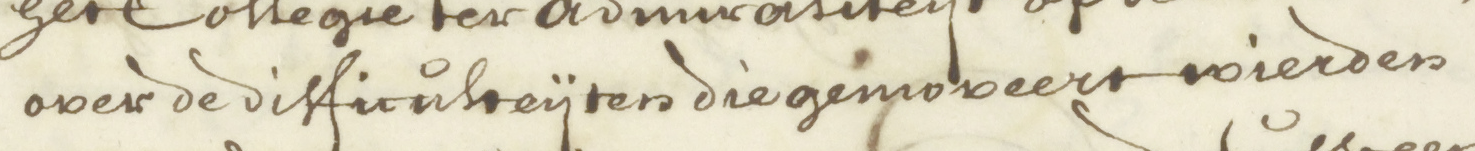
over de difficusteijten die gemoveert wierden
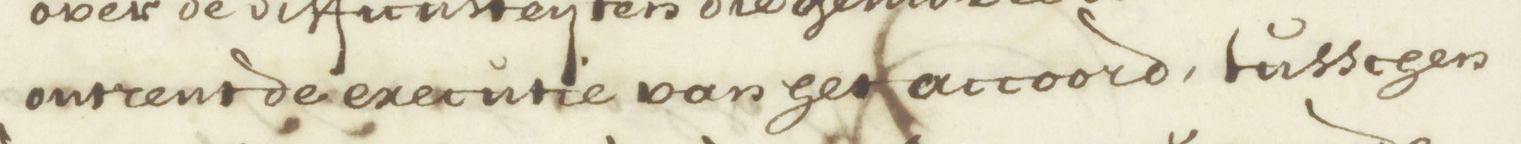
ontrent de executie van het accoord, tusschen
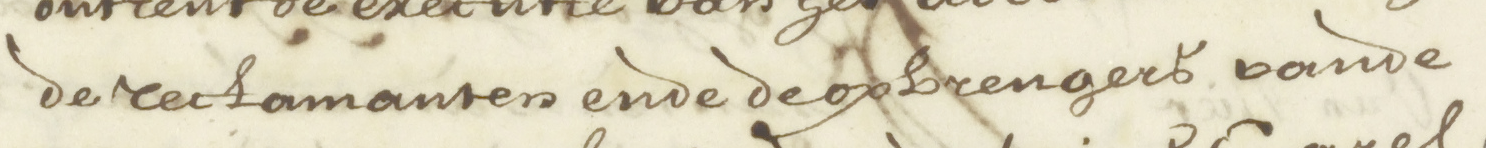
de reclamanten ende de opbrengers vande
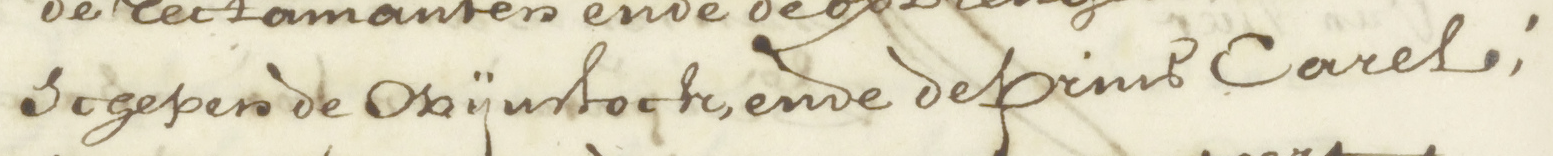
schepen de Wijnstock, ende de prins Carel,
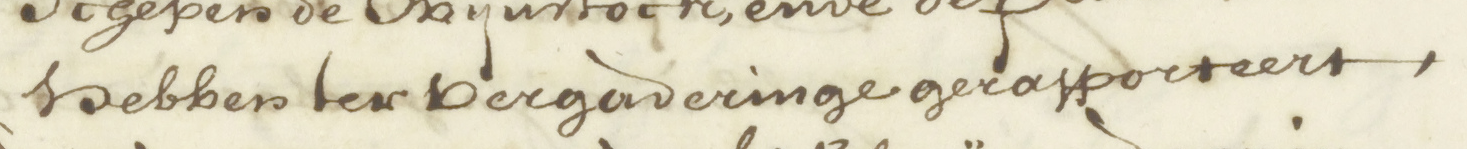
hebben ter vergaderinge gerapporteert,
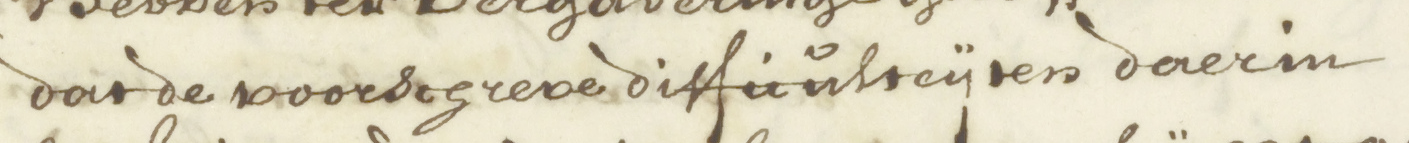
dat de voorschreve difficulteijten daerin
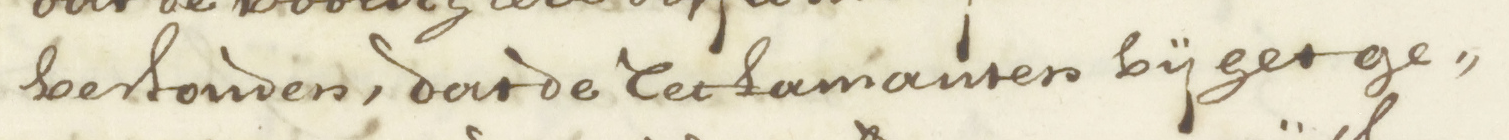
bestonden, dat de reclamanten bij het ge„
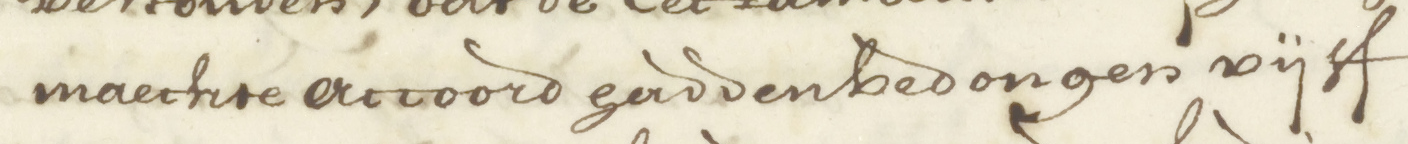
maeckte accoord hadden bedongen vijff
